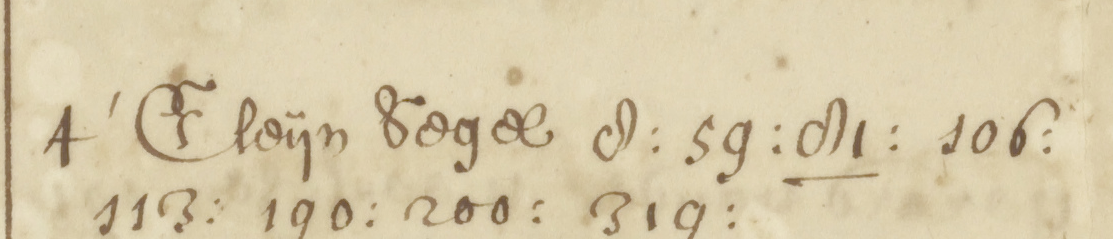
t' Cleijn Segel 8: 59: 81: 106:
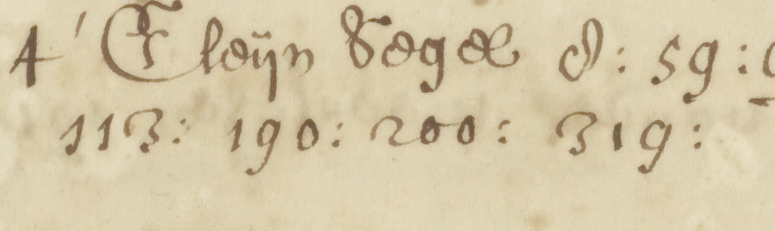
113: 190: 200: 319:
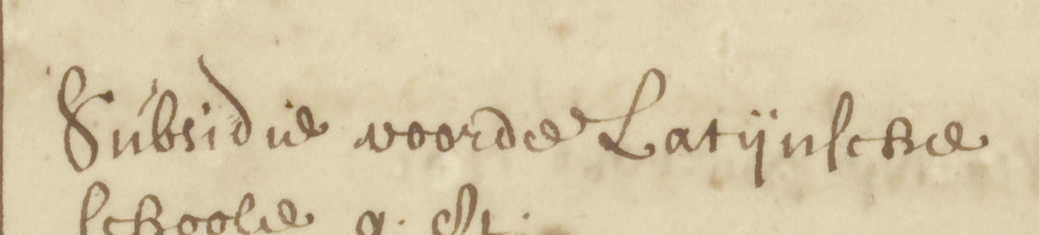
Subidie voorde Latijnsche
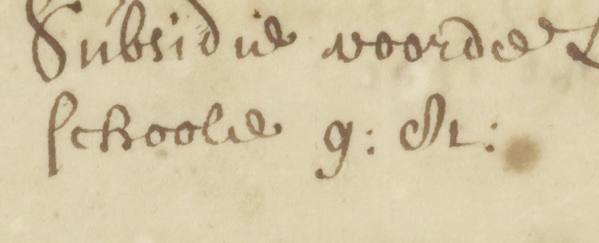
schoole 9: 81:
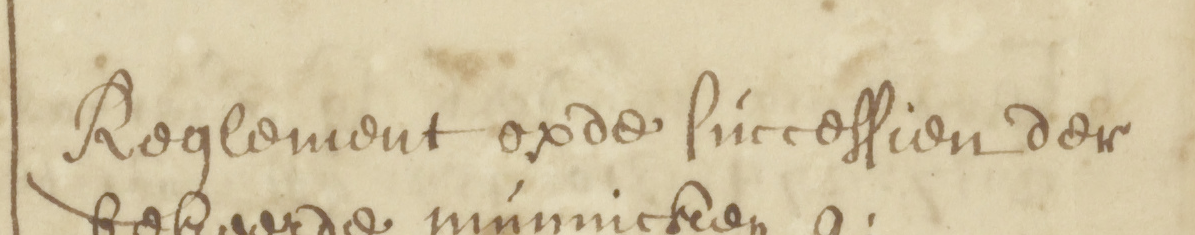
Reglement opde successien der
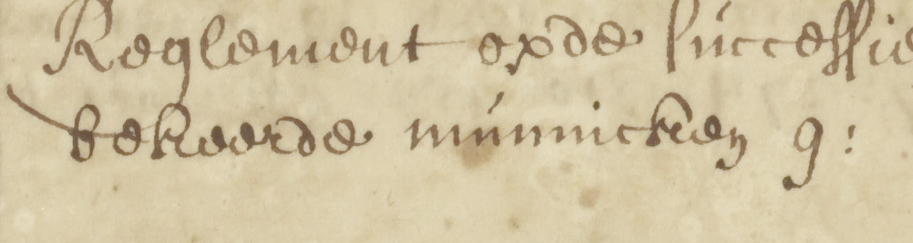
bekeerde munnicken 9:
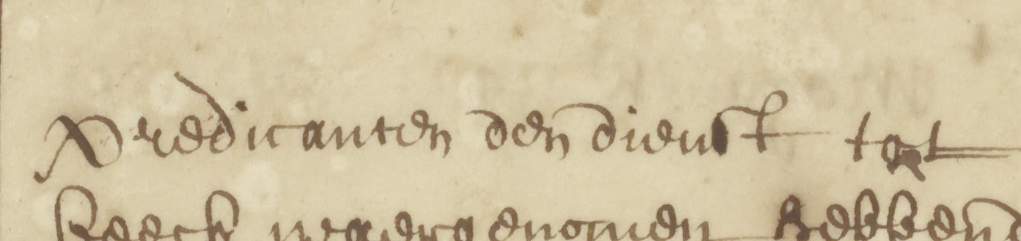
Predicanten den dienst tot
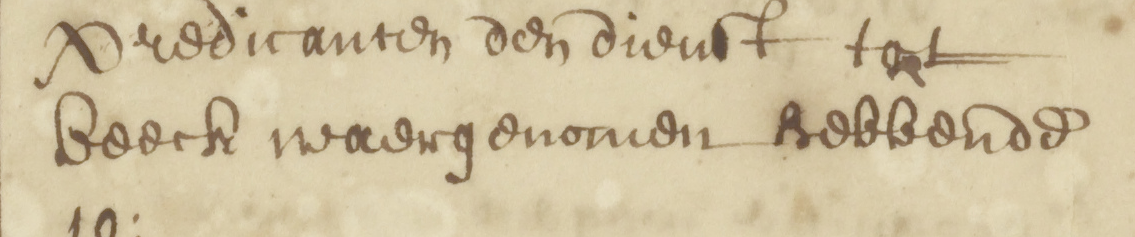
beeck waergenomen hebbende
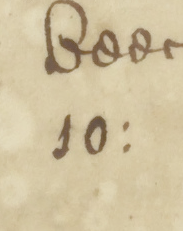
10:
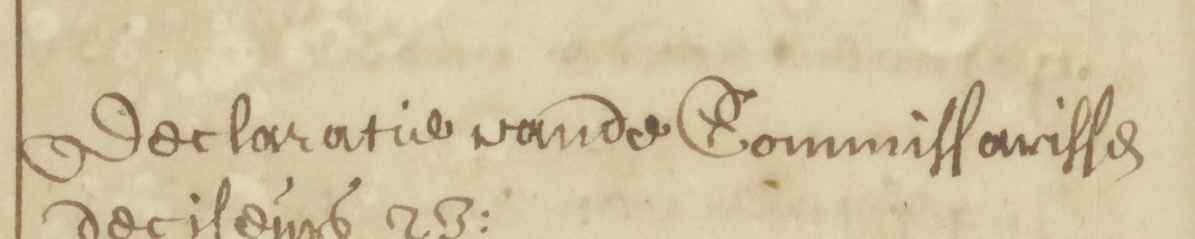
Declaratie vande Commissarissen
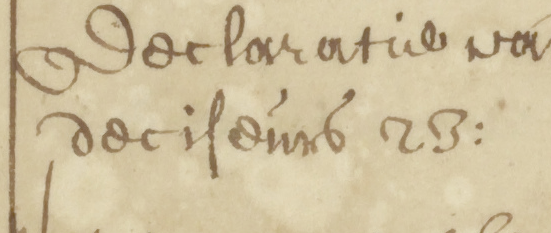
deciseurs 23:
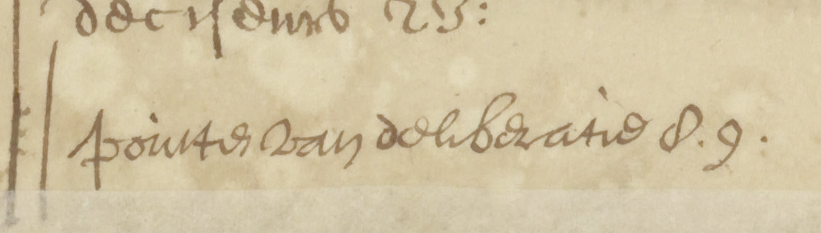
pointen van deliberatie 8.9.
